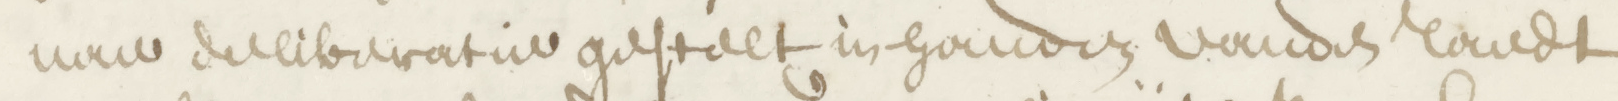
nae deliberatie gestelt in handen vanden Raedt
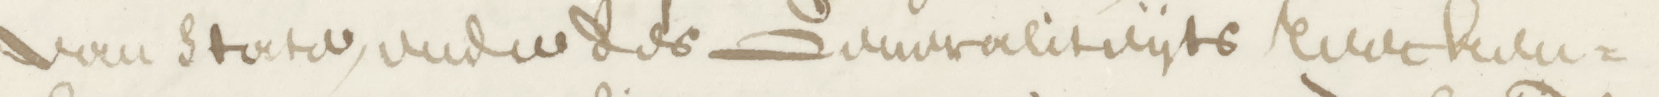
van State, ende des Generaliteijts Reecken„
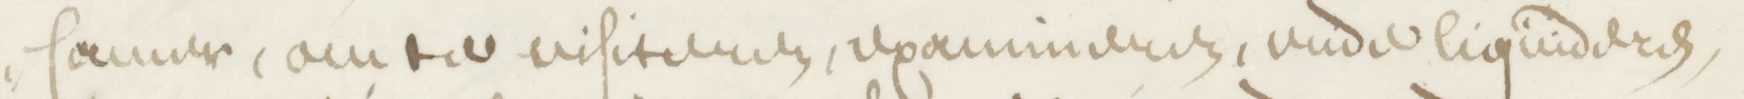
„Camer, om te visiteren, examineren, ende liquideren,
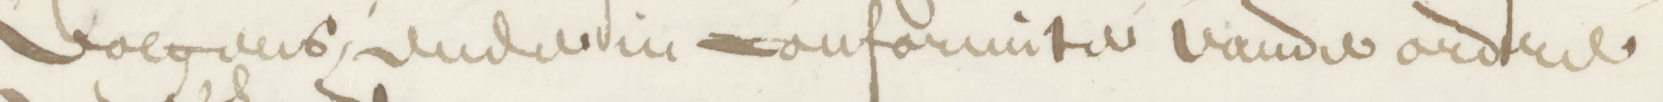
volgens, ende in conformité vande ordre
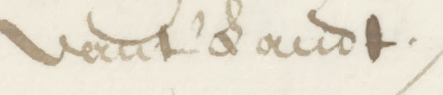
vant‛ Landt.
